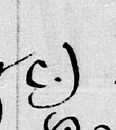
c.)
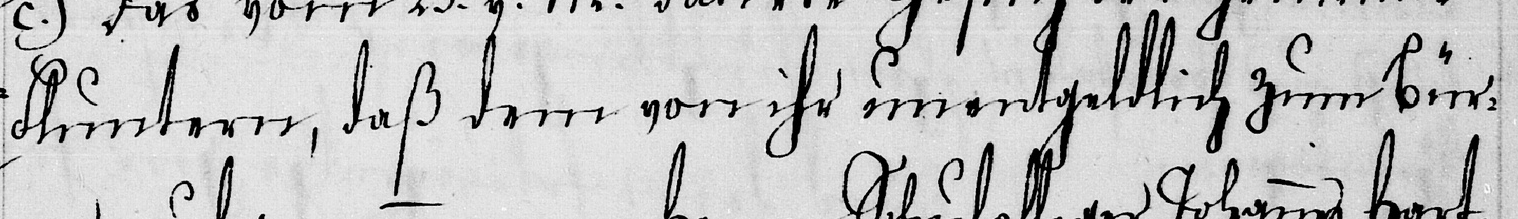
Fluntern, daß dem von ihr unentgeldlich zum Bür¬
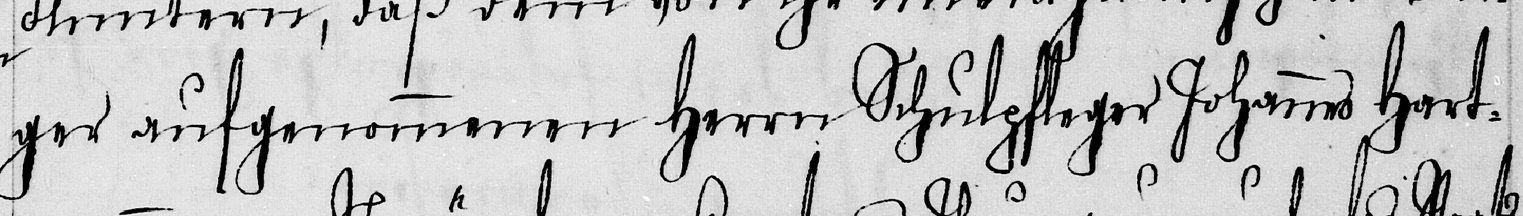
ger aufgenommenen Herrn Schulpfleger Johannes Hart¬
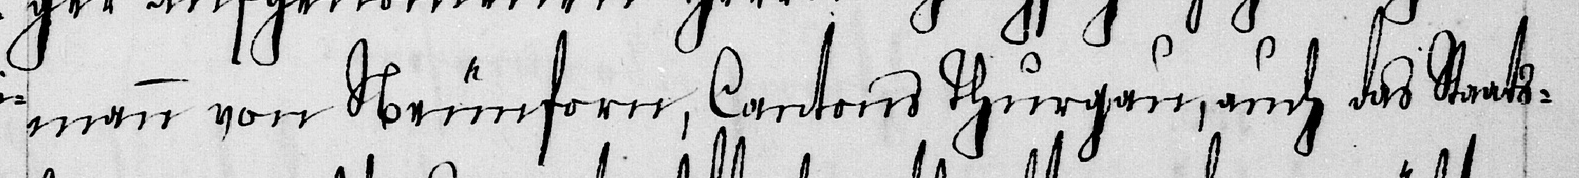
mann von Neunforn, Cantons Thurgau, auch das Staats¬
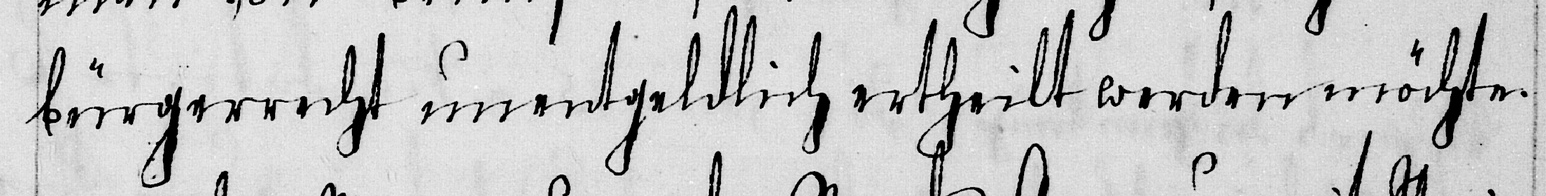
bürgerrecht unentgeldlich ertheilt werden möchte.
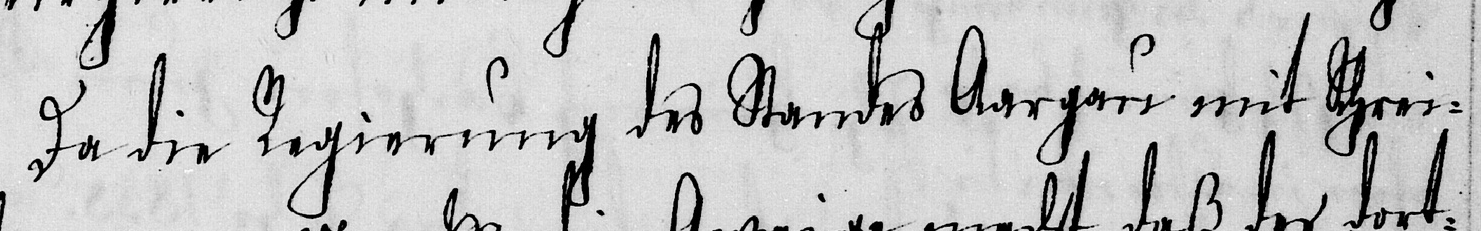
Da die Regierung des Standes Aargau mit Schrei¬
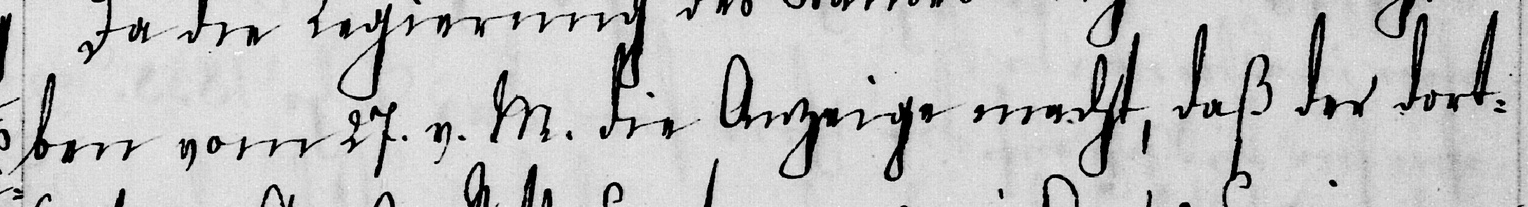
ben vom 27. v. M. die Anzeige macht, daß der dort¬
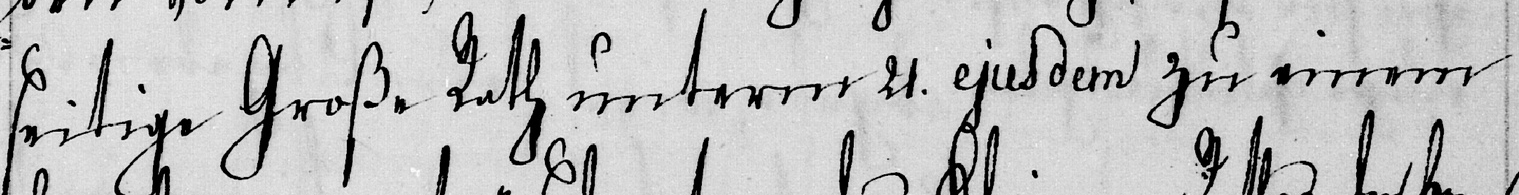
seitige Große Rath unterm 21. eiusdem zu einem
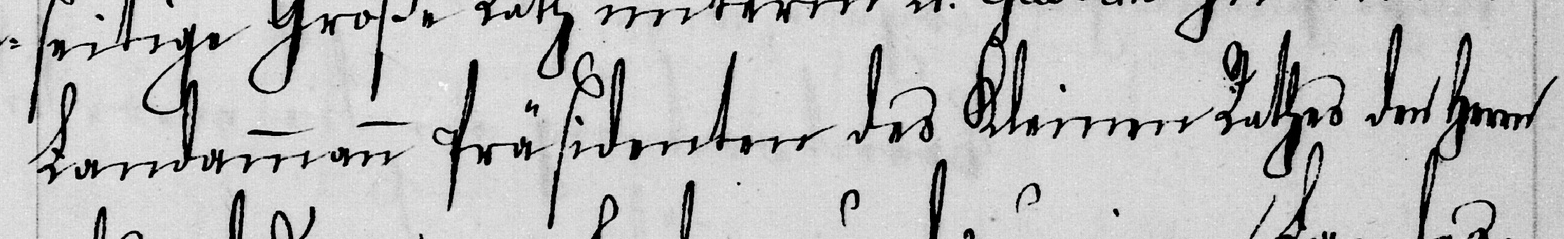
Landammann Präsidenten des Kleinen Rathes den
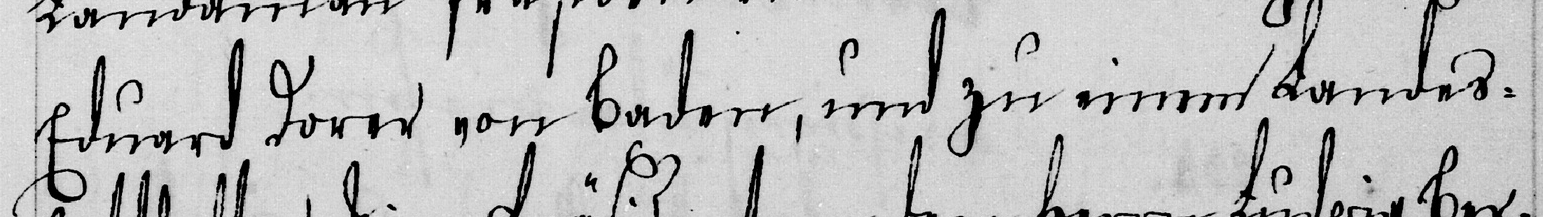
Eduard Dorer von Baden, und zu einem Landes¬
